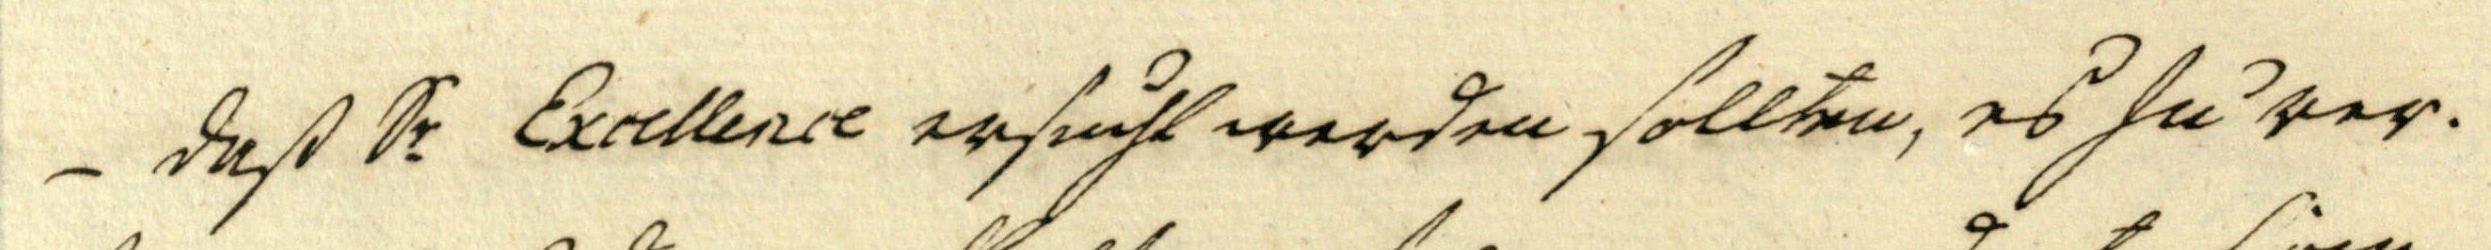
— daß Sr Excellence ersucht werden sollten, es zu ver¬
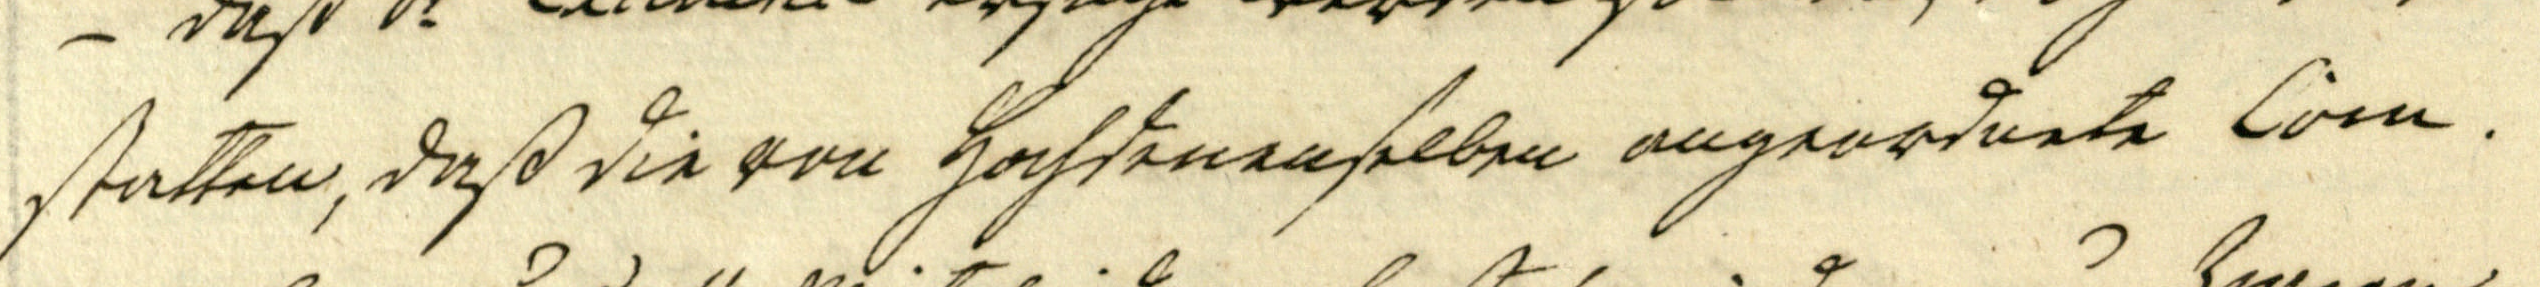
statten, daß die von Hochdenenselben angeordnete Com¬
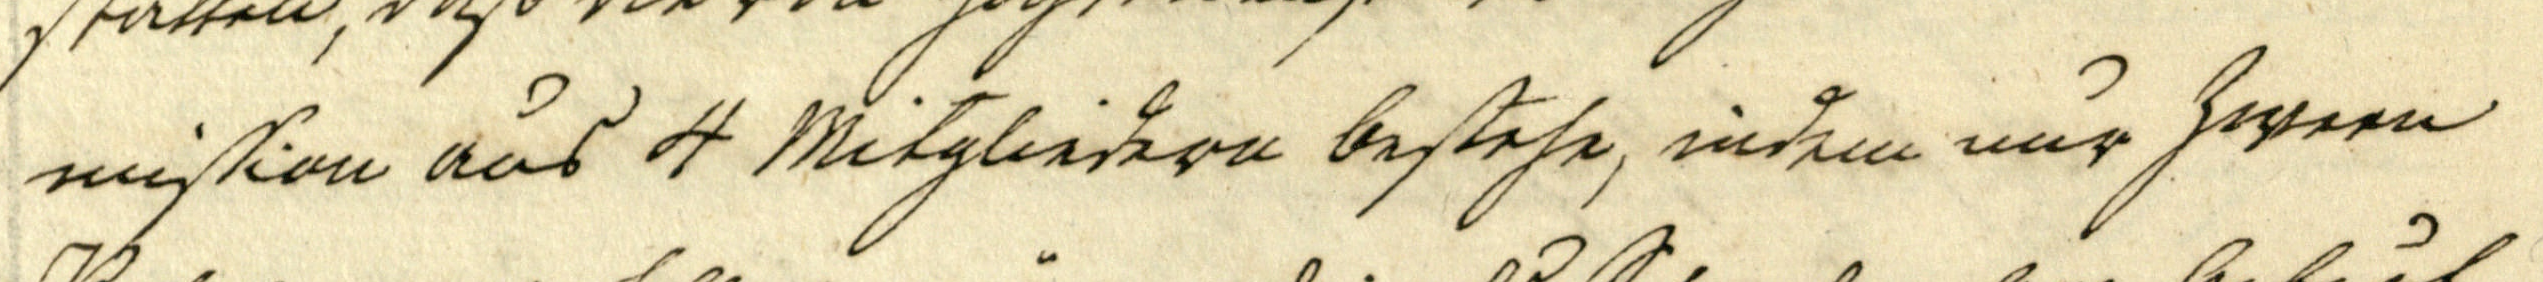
mission aus 4 Mitgliedern bestehe, indem nur Zween
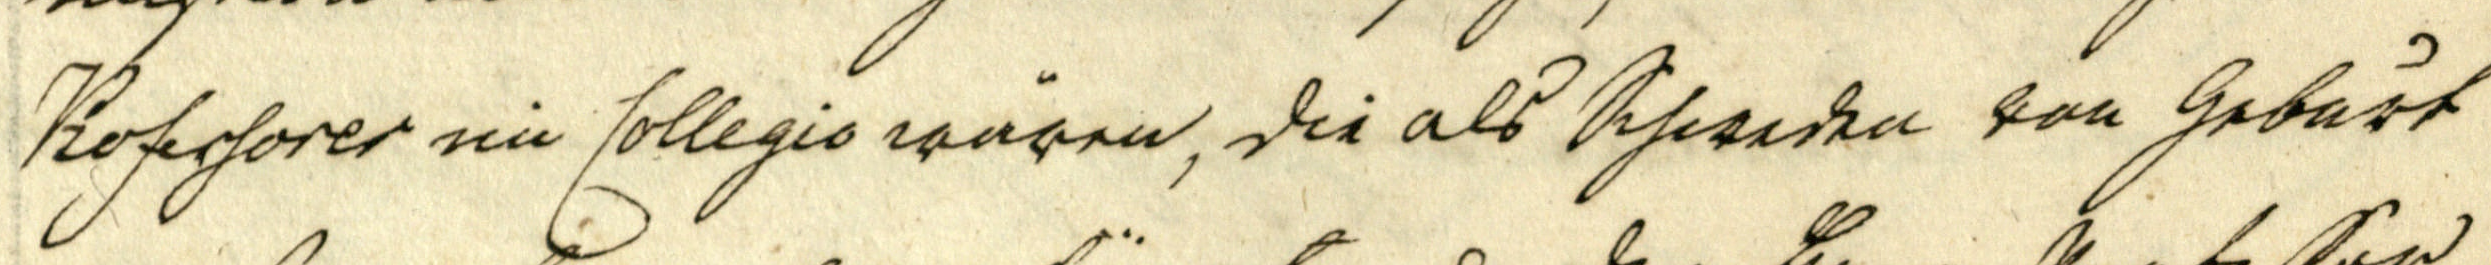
Professores im Collegio wären, die als Schweden von Geburt
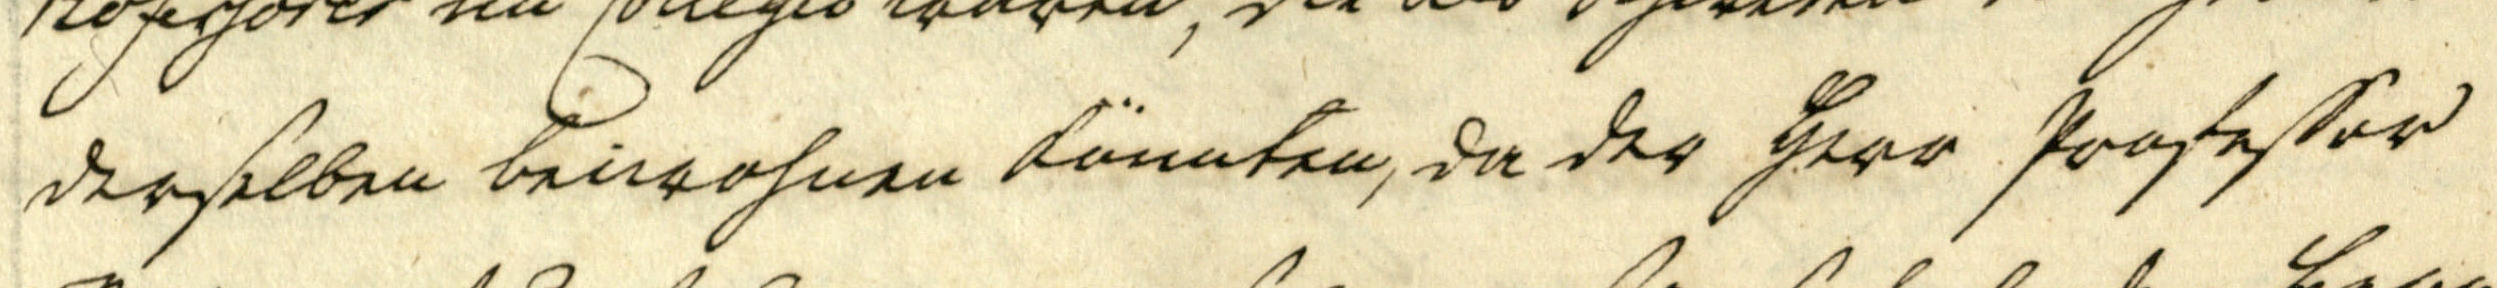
derselben beiwohnen könnten, da der Herr Professor
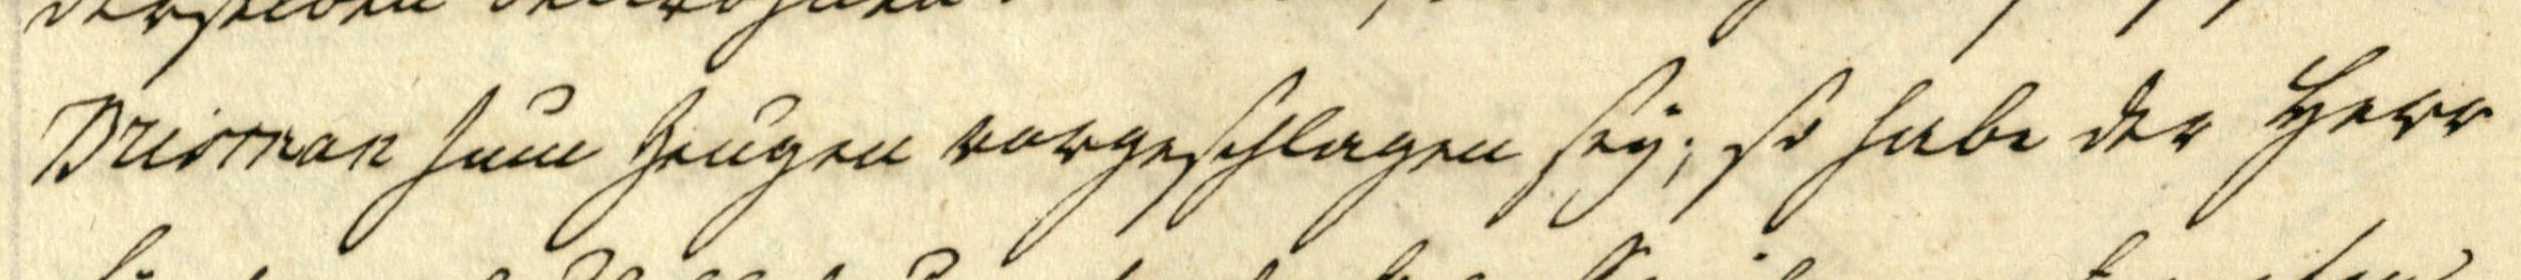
Brisman zum Zeugen vorgeschlagen seÿ; so habe der Herr
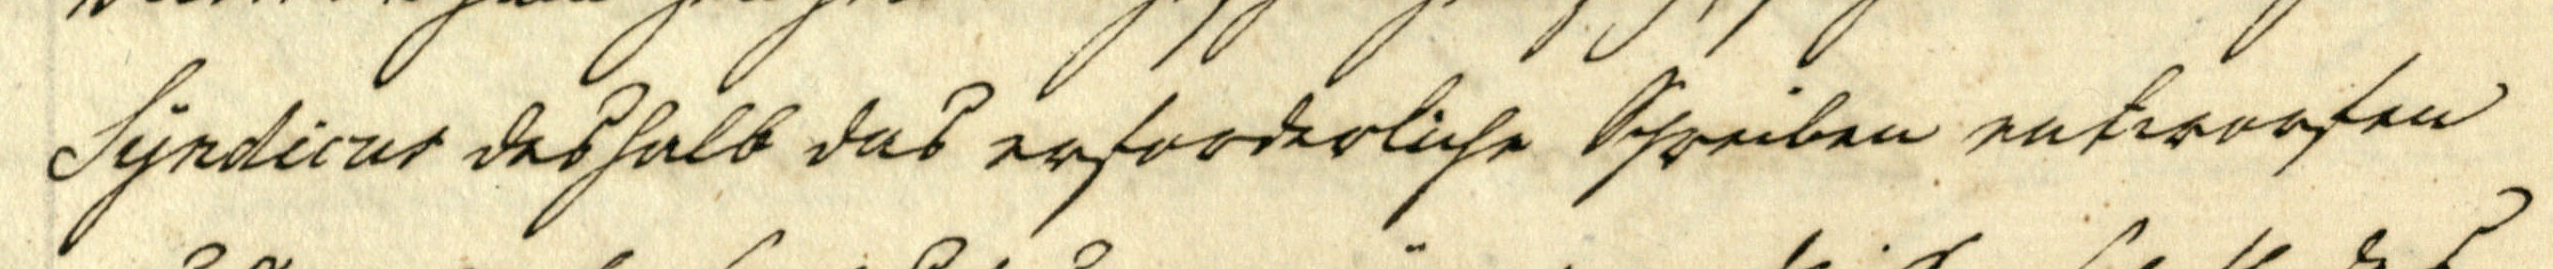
Sÿndicus deshalb das erforderliche Schreiben entworfen
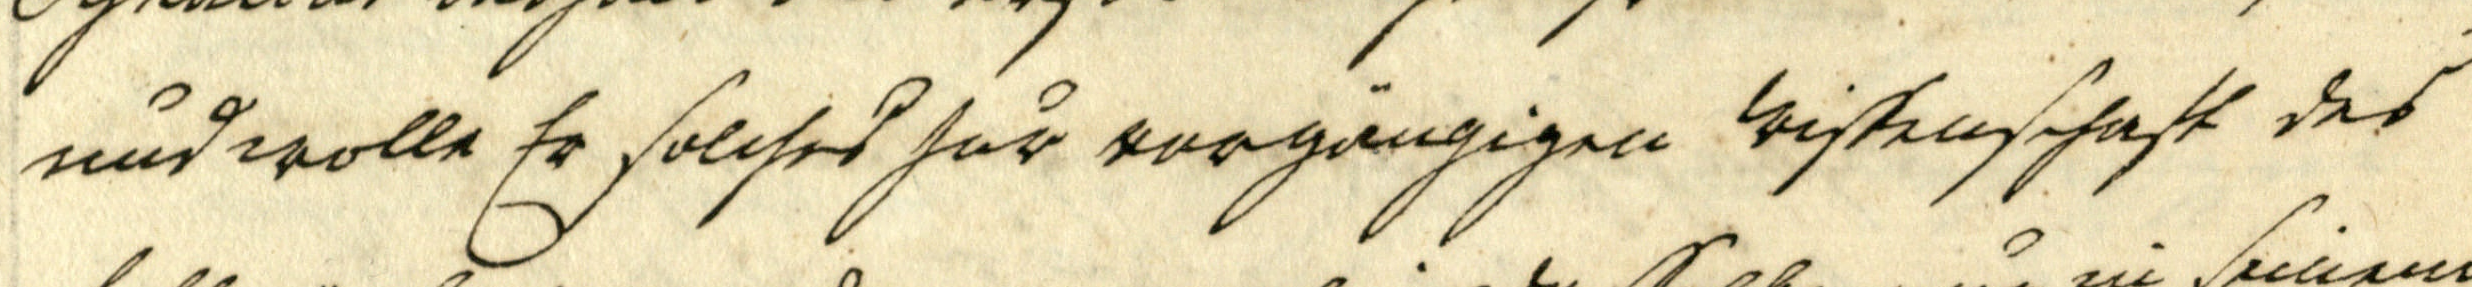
und wolle Er solches zur vorgängigen Wissenschaft des
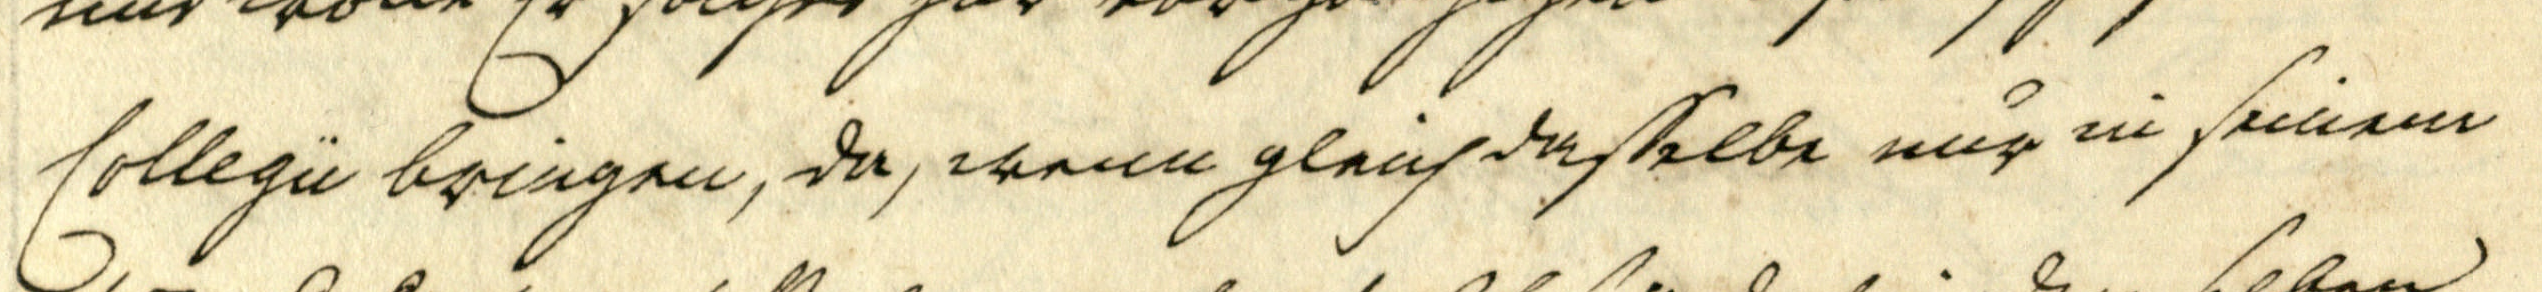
Collegii bringen, da, wenn gleich dasselbe nur im seinem
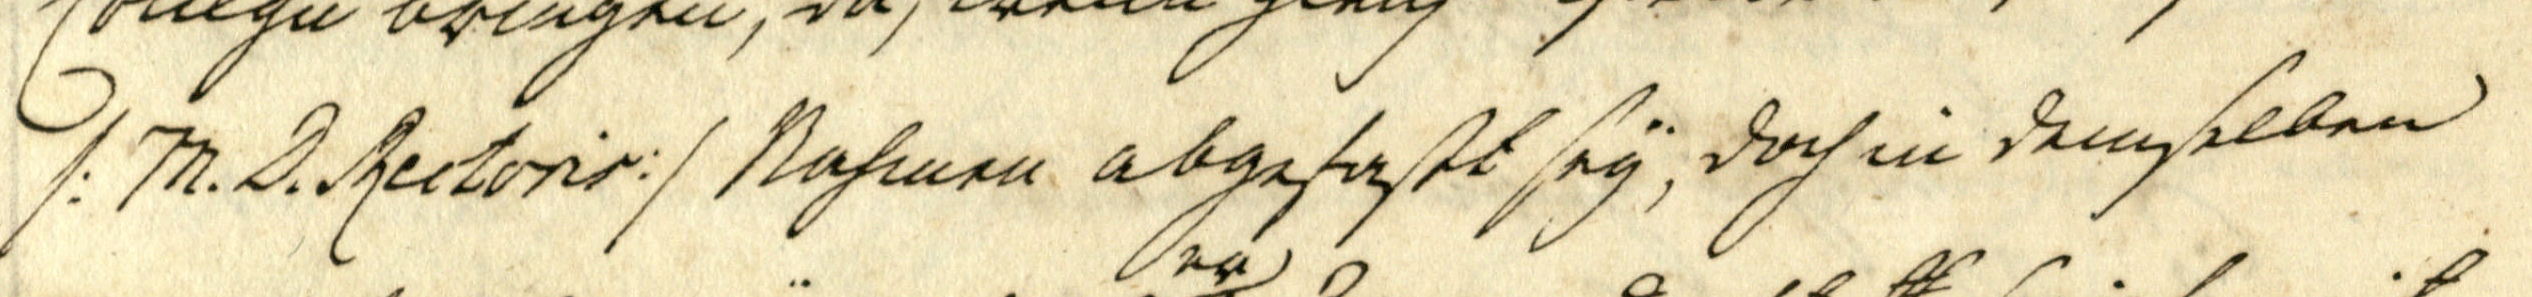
/: M. D. Rector:/ Nahmen abgefaßt seÿ, doch in demselben
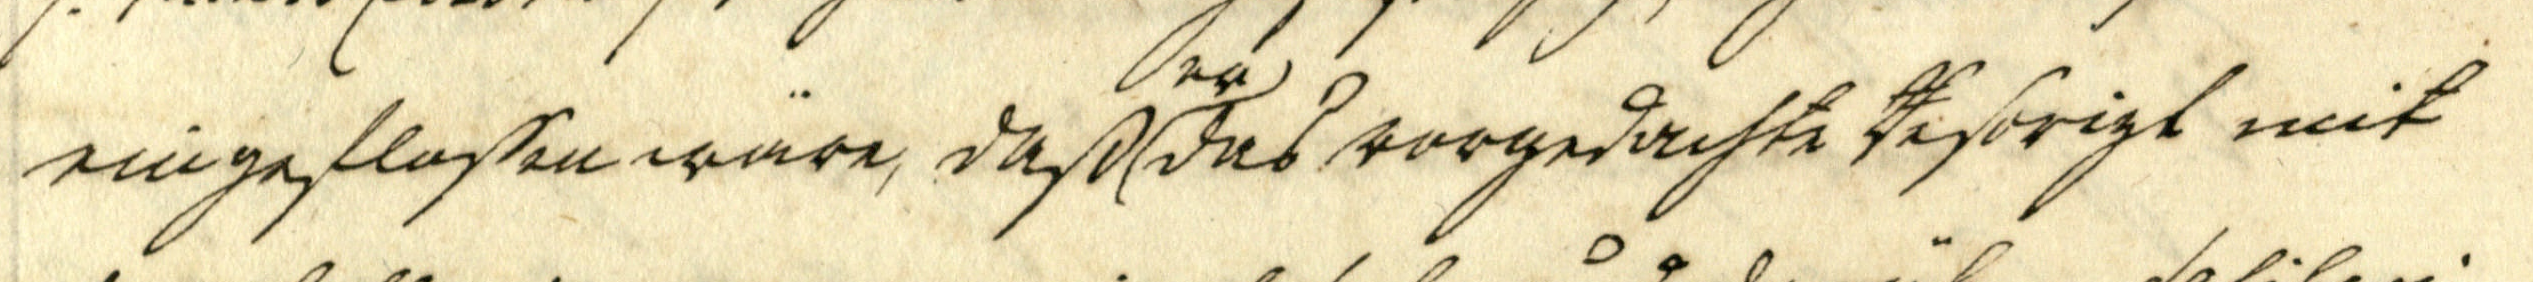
eingeflossen wäre, daß er das vorgedachte Rescript mit
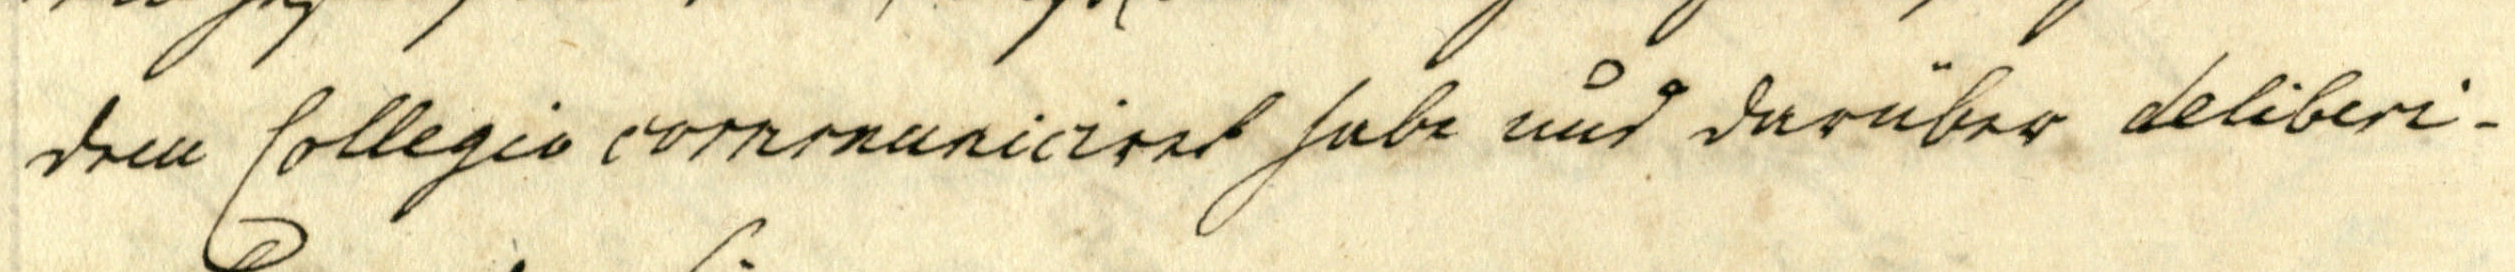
dem Collegio communiciret habe und darüber deliberi¬
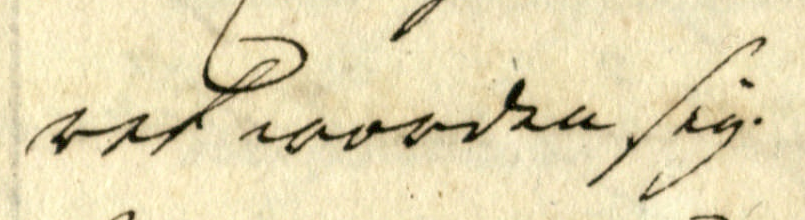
ret worden seÿ.
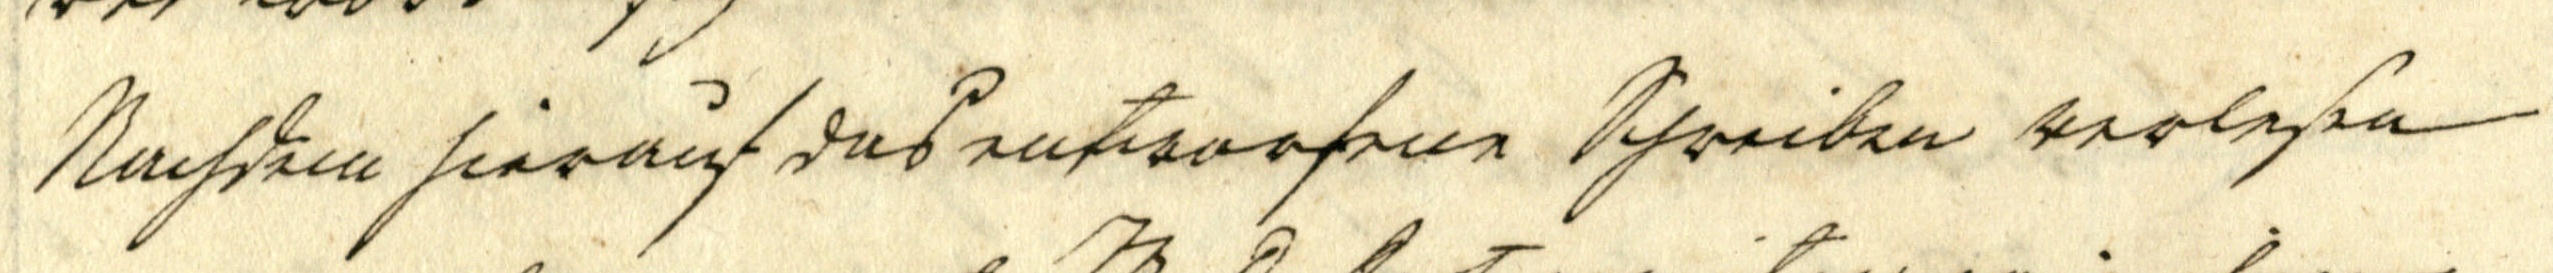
Nachdem hierauf das entworfene Schreiben verlesen
